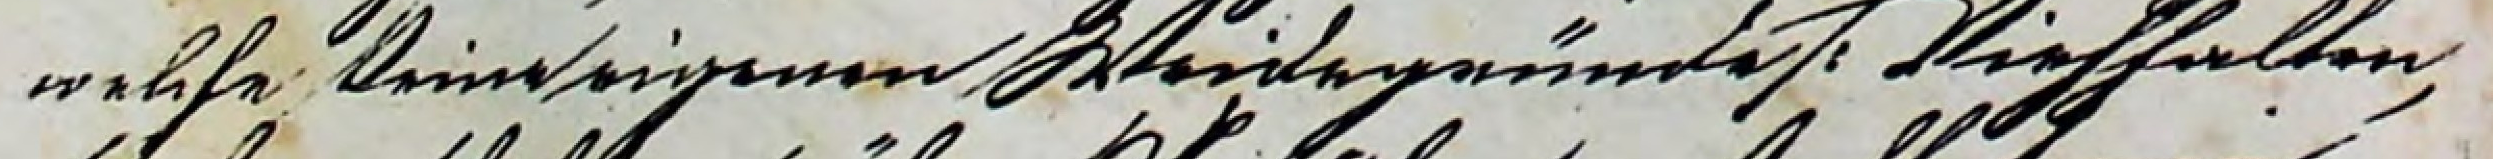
welche Keine eigenen Weidegründe /: Viehhalten,
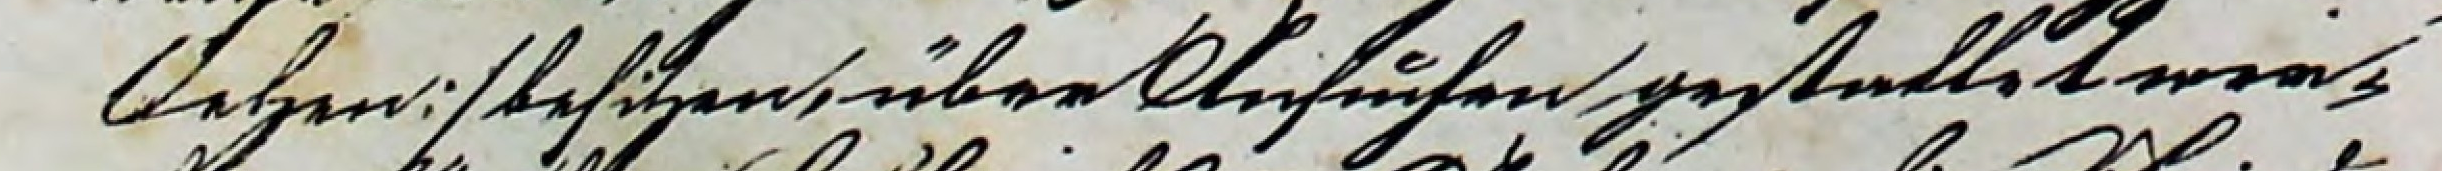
Oetzen :/ besitzen, über Ansuchen gestattet wer„
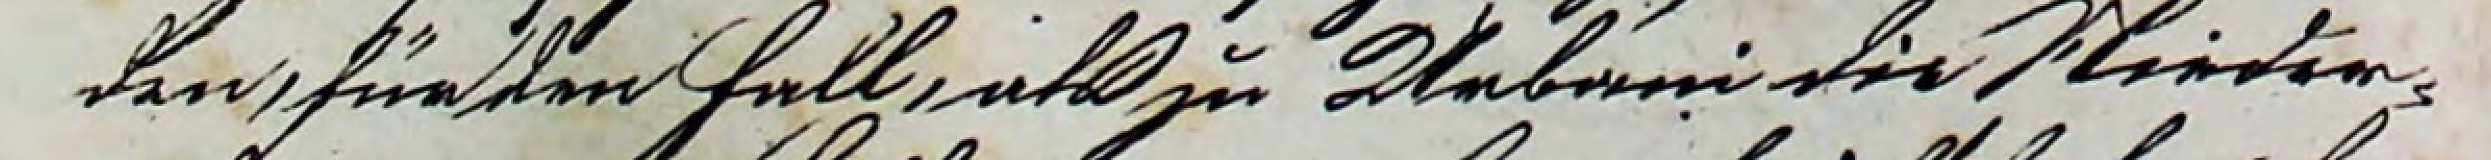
den, für den Hall, als zu Urbani die Nieder„
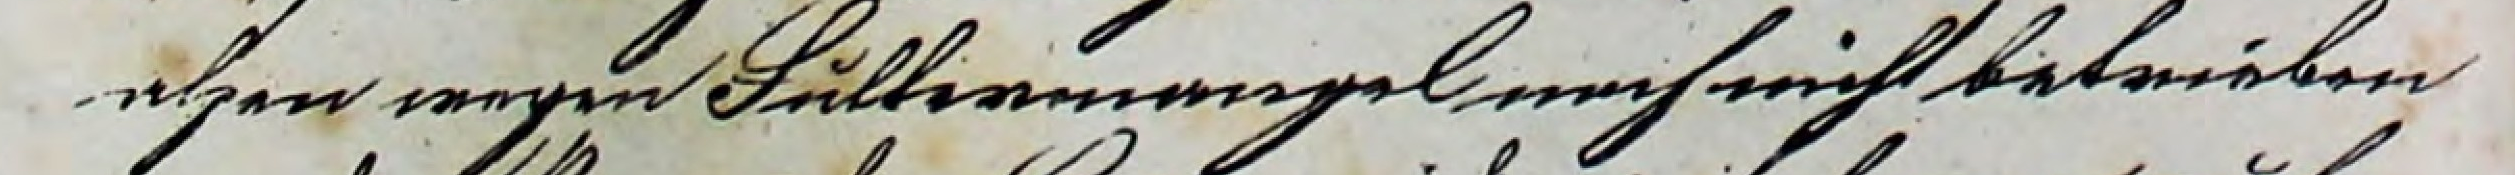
atzen wegen Futtermangel nach nicht betrieben
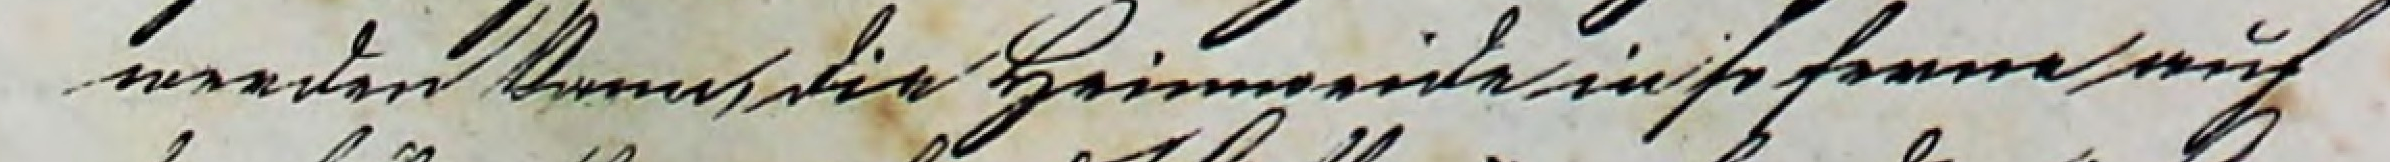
werden kann, die Heimweide in so ferne auf
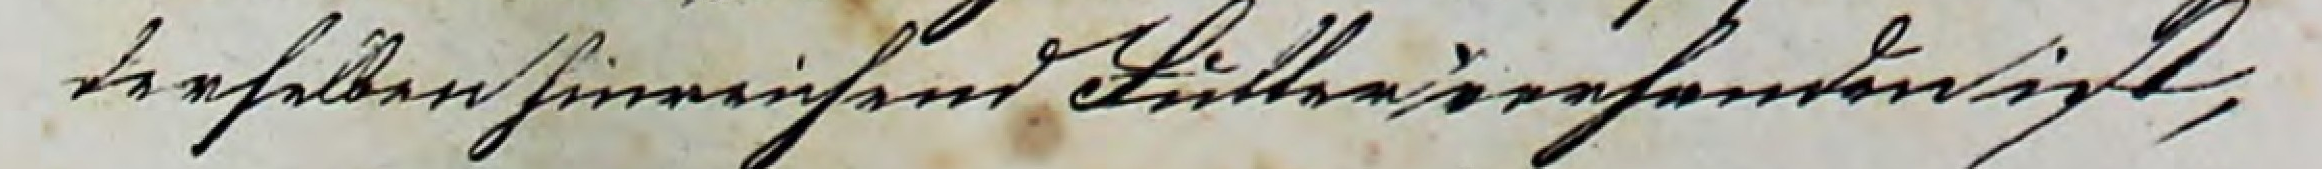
derselben hinreichend Futter vorhanden ist,
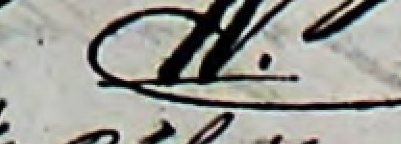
IV.
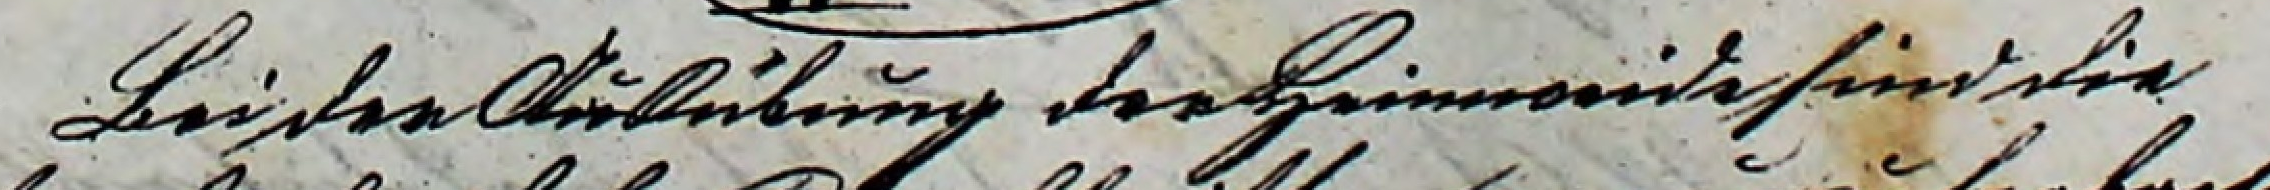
Bei der Ausübung der Heimweide sind die
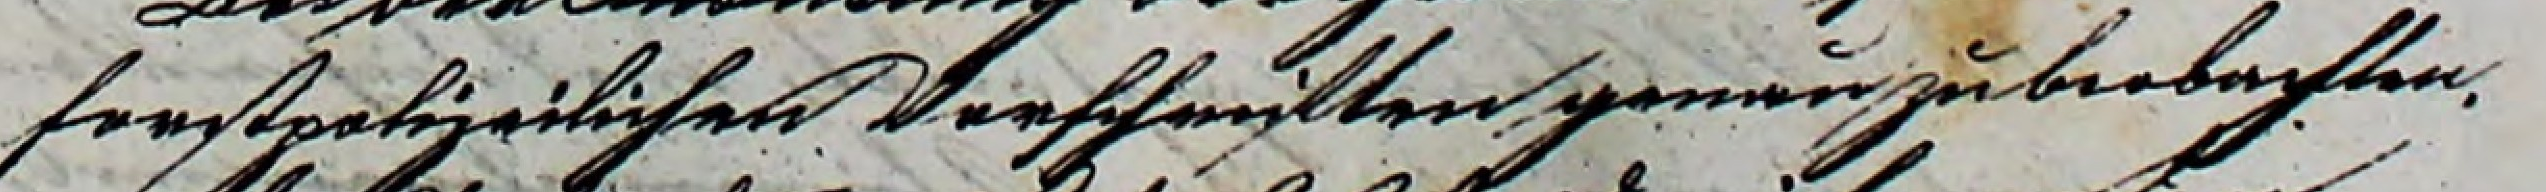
forstpolizeilichen Verschriften genau zu beobachten,
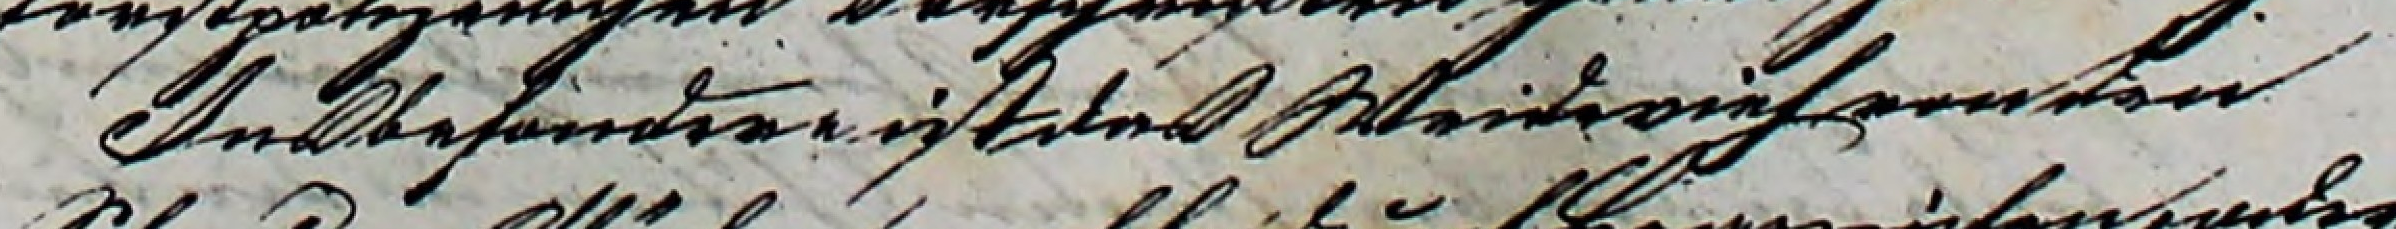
Insbesondere ist das Weiderieh von den
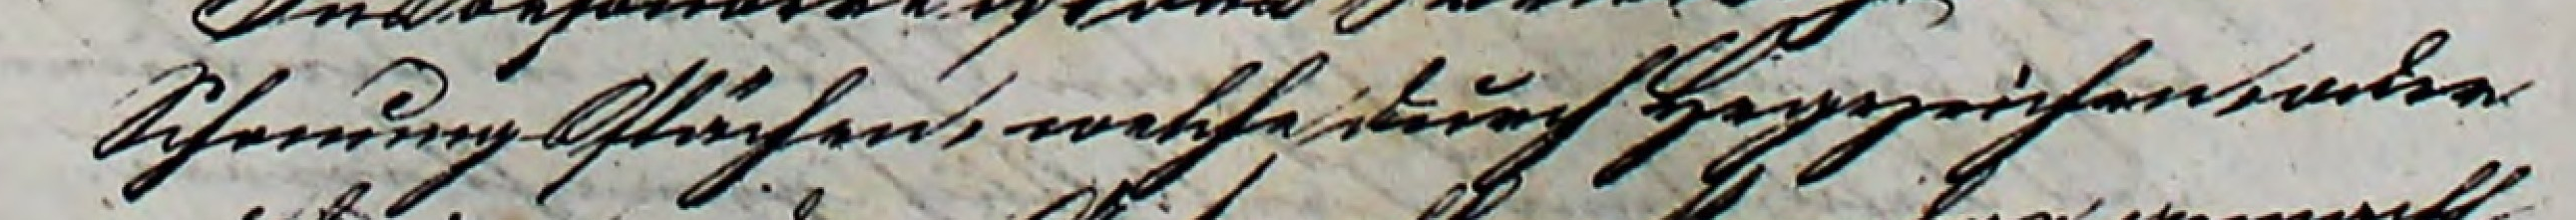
Schonungsflächen, welche durch Hegezeichen, oder
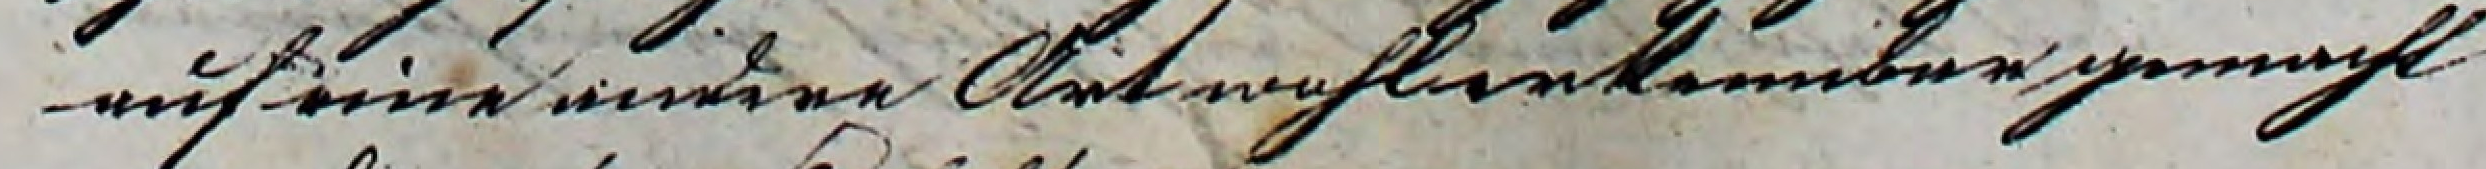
auf eine andere Art wohl er kenn bar gemacht
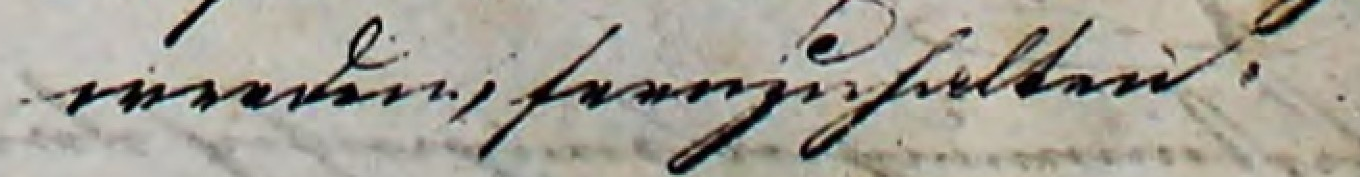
werden, fernzuhalten. ./.
